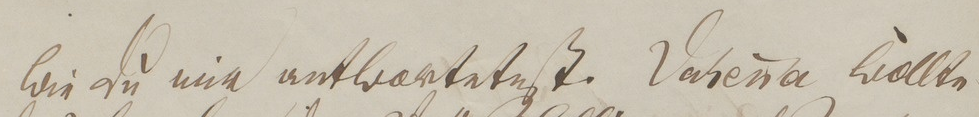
wie Du mir antwortetest. Varenna wollte
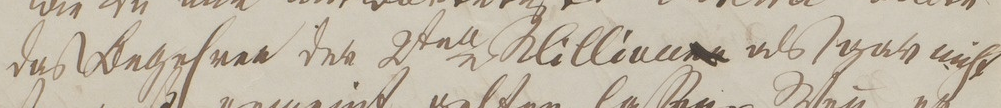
das Begehren der 2ten Millionen als gar nicht
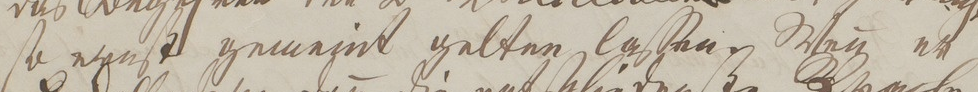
so ernst gemeint gelten lassen. Wenn er
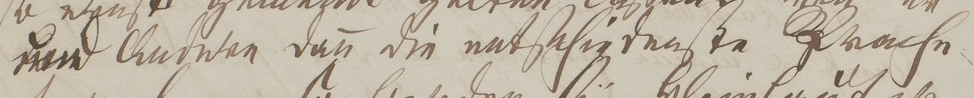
und Andere dann die entschiedenste Sprache
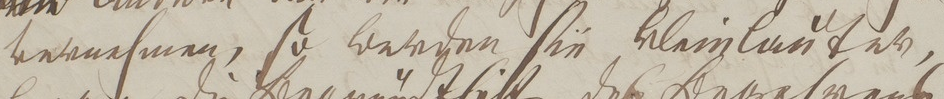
vernehmen, so werden sie kleinlauter,
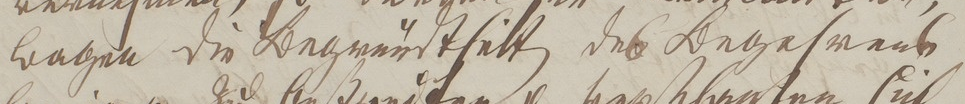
wagen die Begründtheit des Begehrens
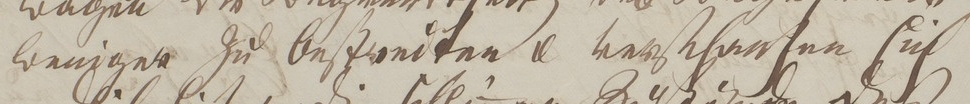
weniger zu bestreiten & verschanzen sich
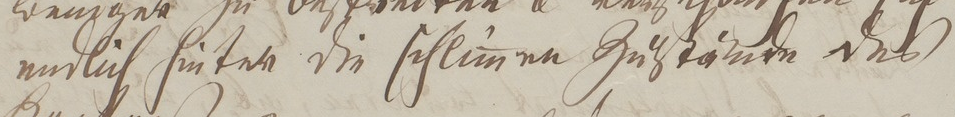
endlich hinter die schlimmen Zustände des
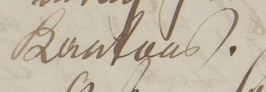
Kantons.
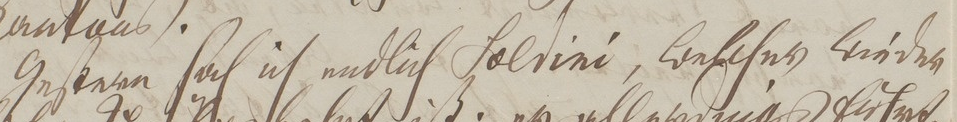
Gestern sah ich endlich Soldini, welcher wieder
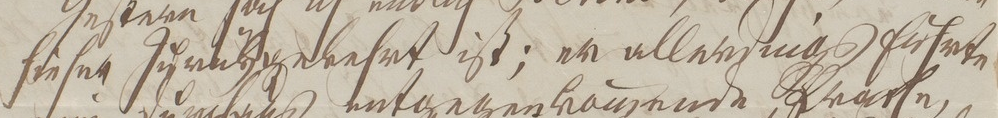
hieher zurükgekehrt ist; er allerdings führte
